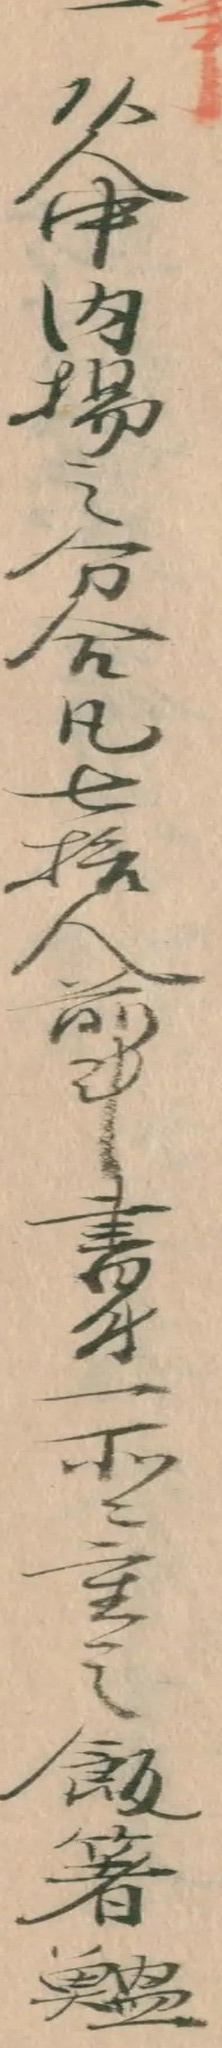一頭人中内揚之分合凡七拾人前斗書付一所に重之飯箸鰛
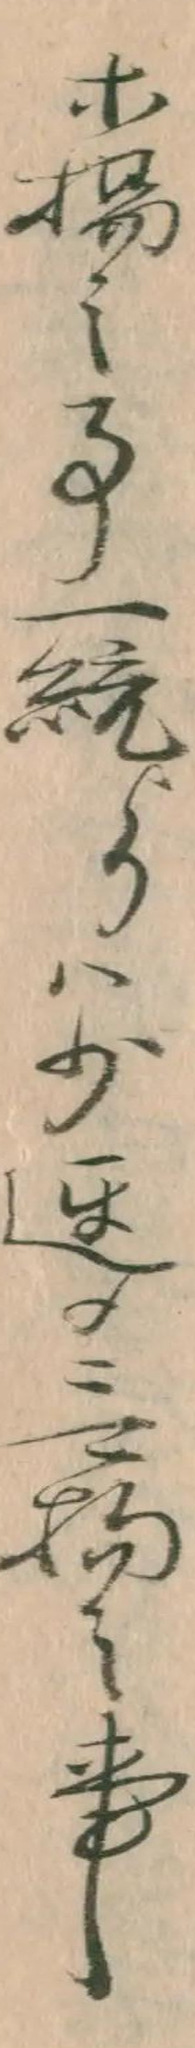等揚之事一統よりハ少遅〆御可物之事
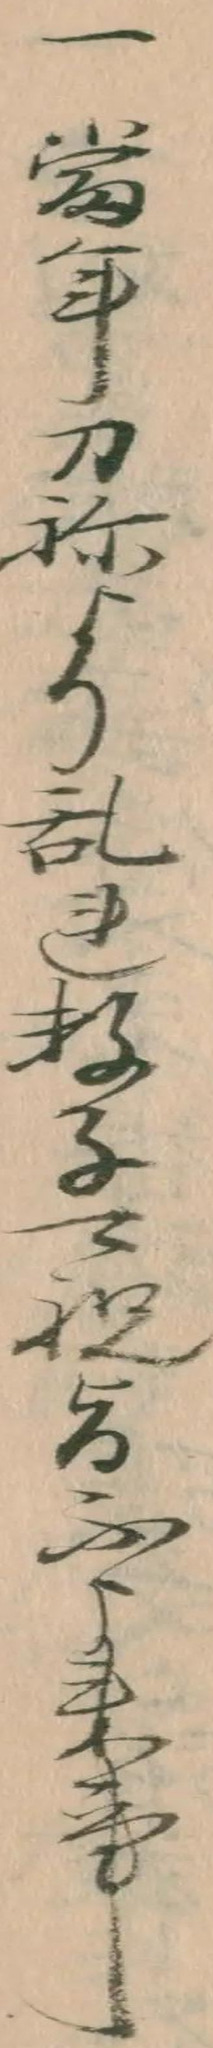一當年刀祢より乱れ数子可祝旨不申来事
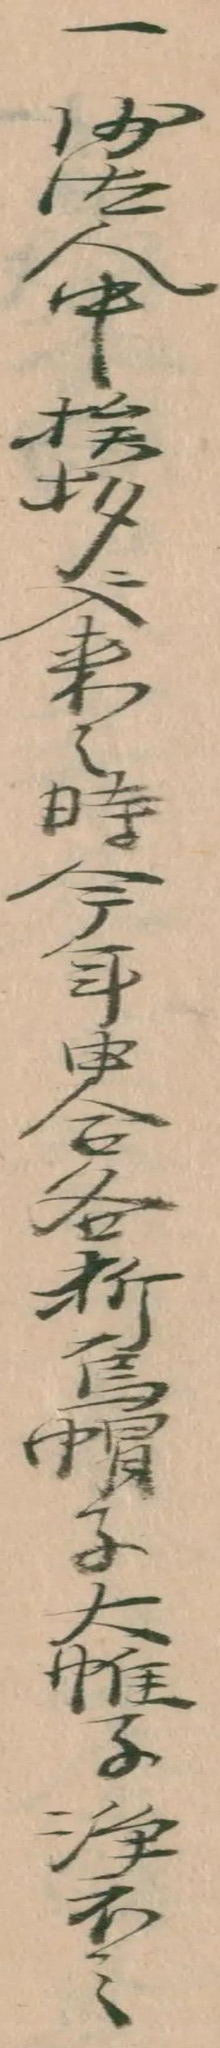一沙汰人中之挨拶ニ入来之時今年申合各折烏帽子大帷子浄衣之
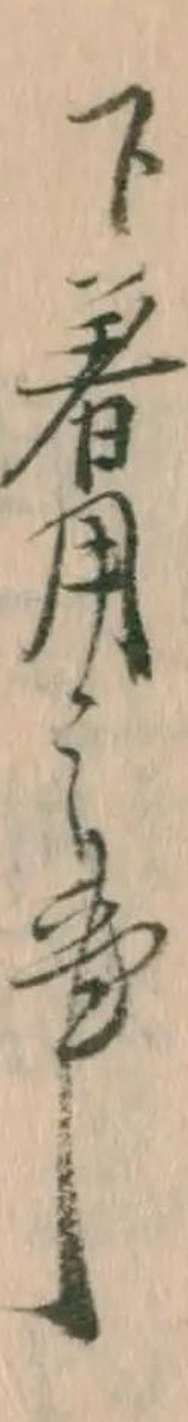下着用之事
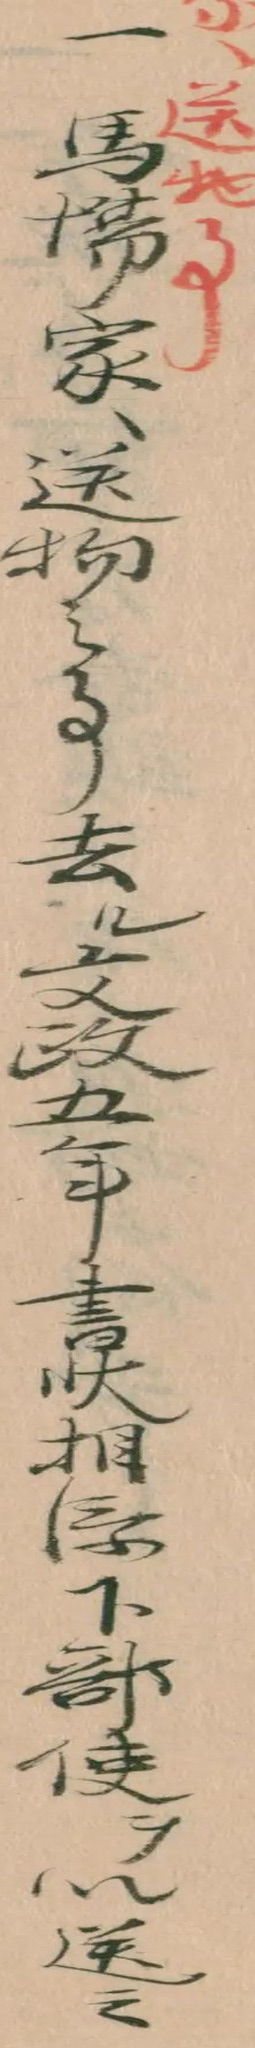一馬場家へ送物之事去る文政五年書状相添下部使ヲ以送之
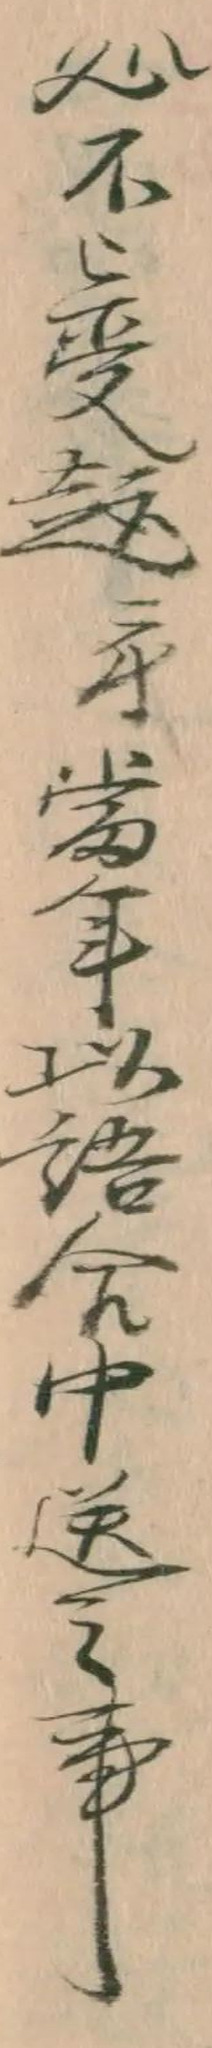処不被受趣ニ付當年以語合中送之事
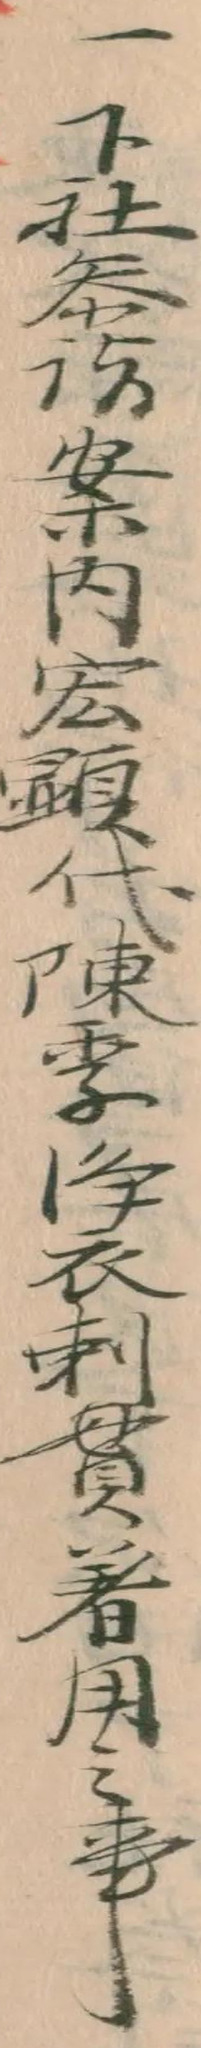一下社参詣案内宏顕代陳季浄衣刺貫着用之事
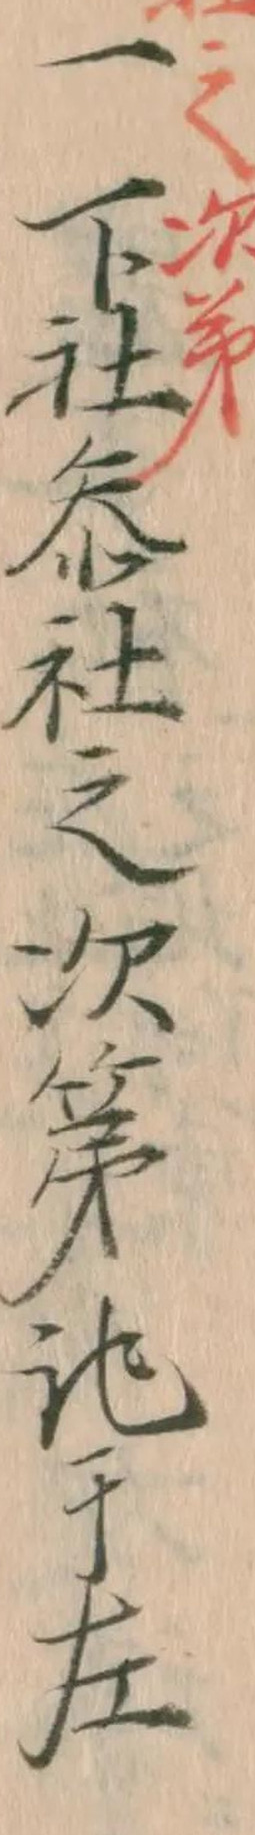下社参社之次第記于左

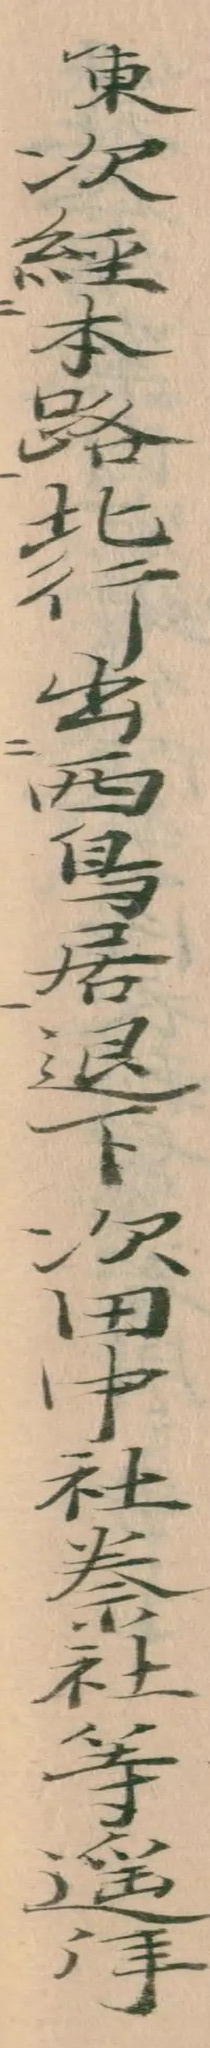東次経本路北行出西鳥居退下次田中社参社等遥拝
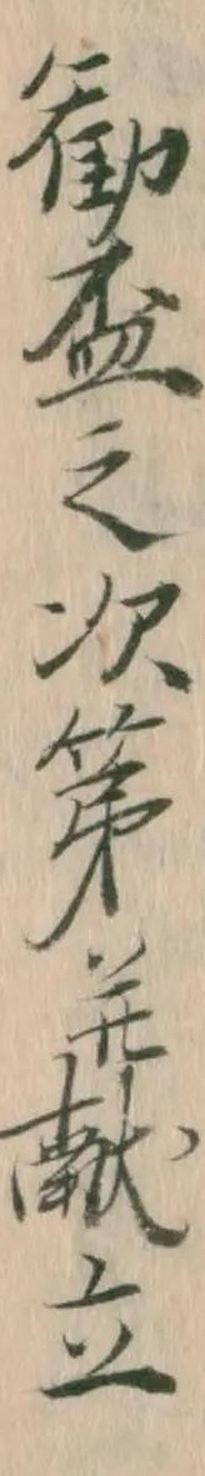勧盃之次第并献立

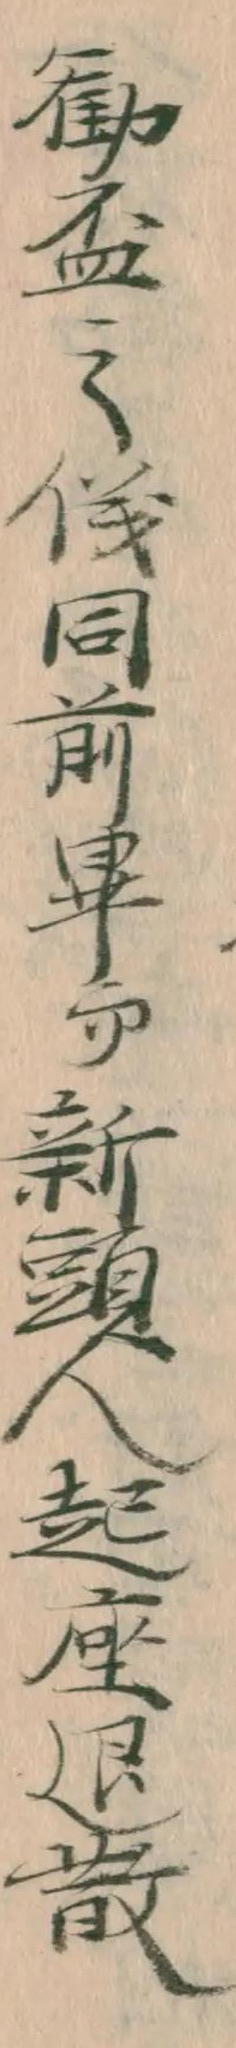勧盃之儀同前畢而新頭人起座退散
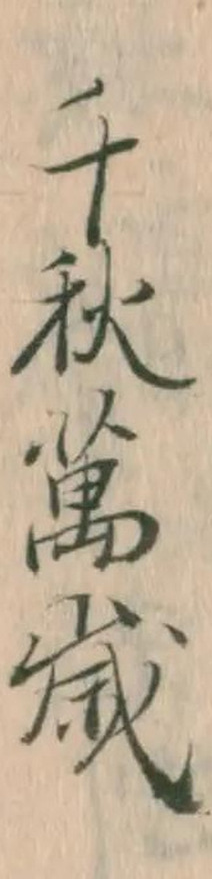千秋万歳
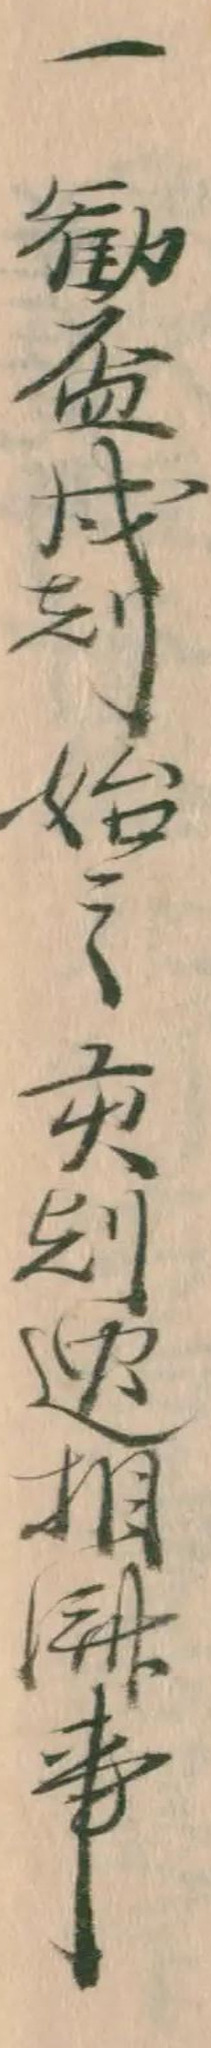一勧盃戌刻始之亥刻過相済事
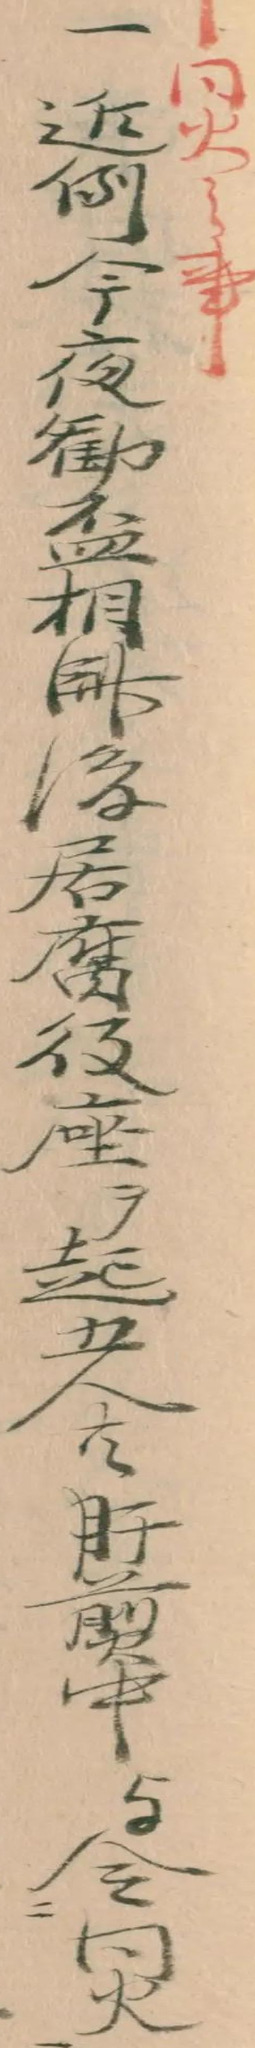一近例今夜勧盃相済後居腐役座ヲ起五人共肝煎中と令二同火
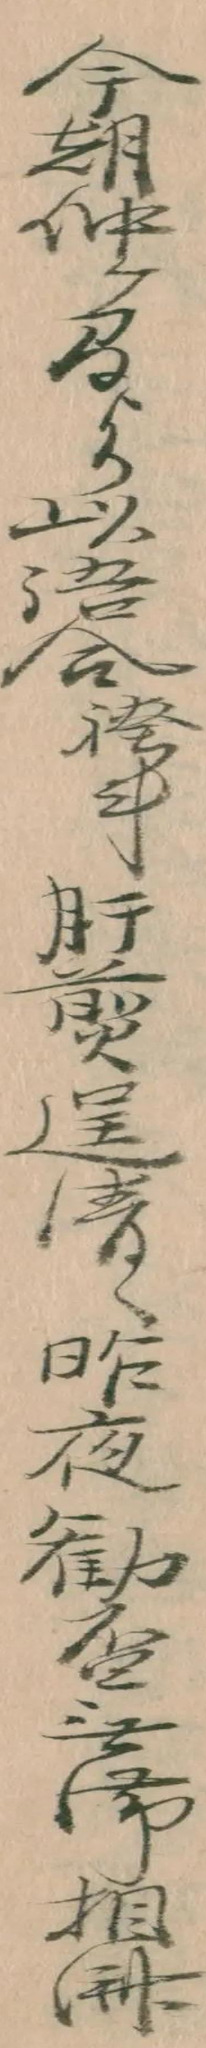一今朝仲ヶ間より以語合袴斗肝煎逞清ヘ昨夜勧盃無滞相済
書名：賀茂社記録. 第74冊
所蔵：国立国会図書館 National Diet Library, JAPAN
